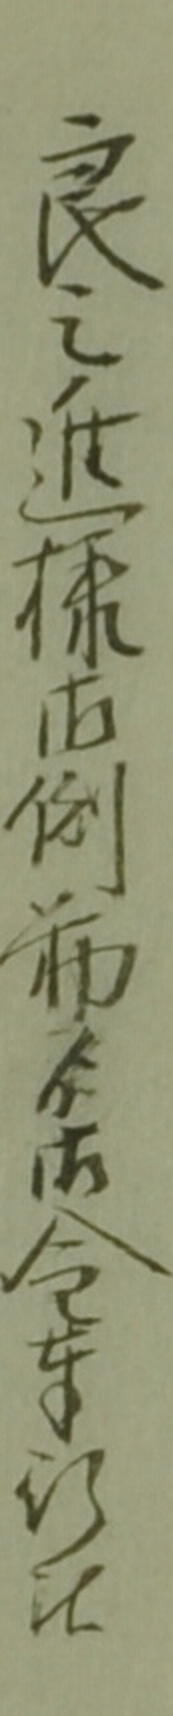良之進様御側勤ゟ御金奉行被
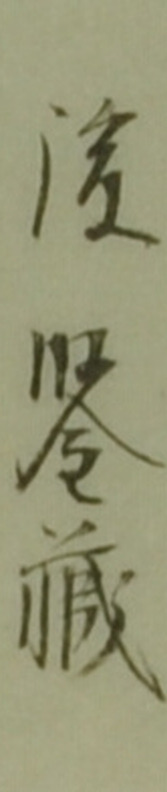後鑒蔵
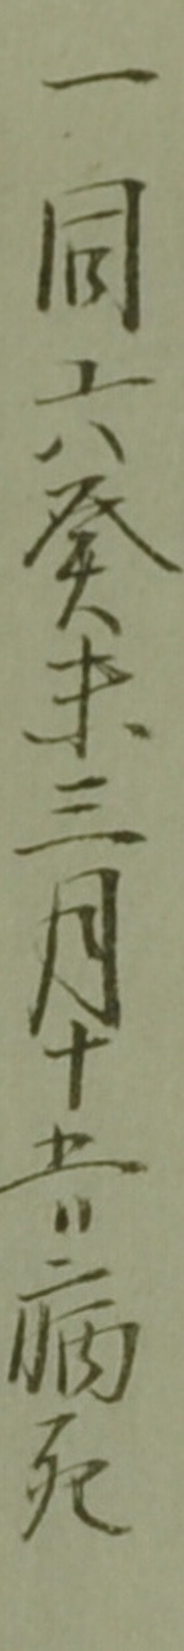一同六癸未三月十五日病死
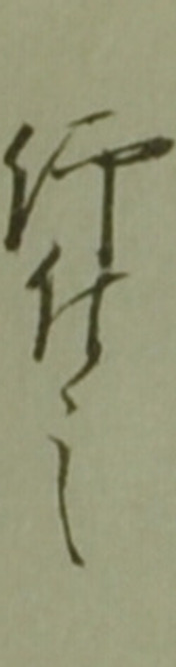仰付之
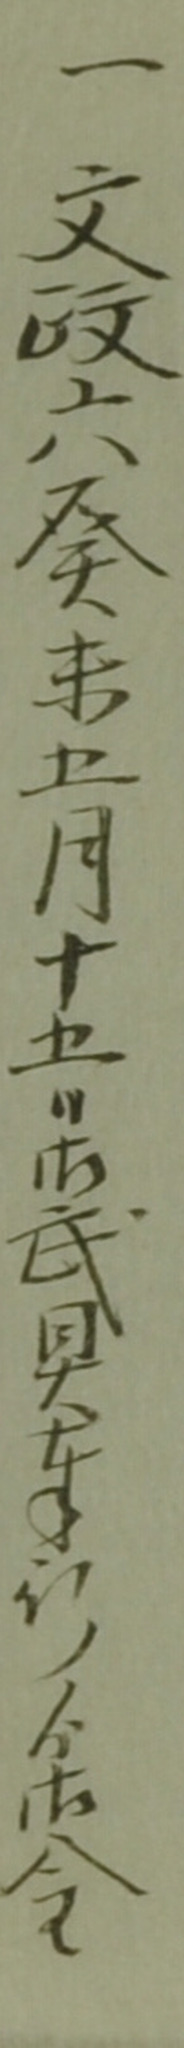一文政六癸未五月十五日御武具奉行ゟ御金
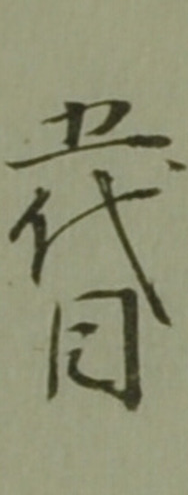五代目
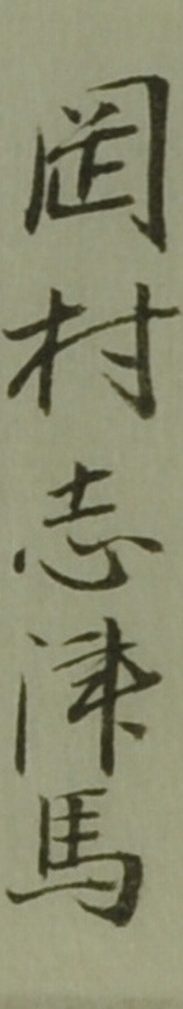岡村志津馬
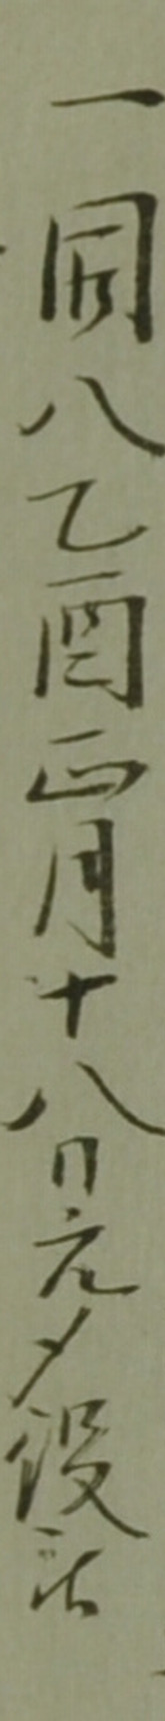一同八乙酉正月十八日元〆役被
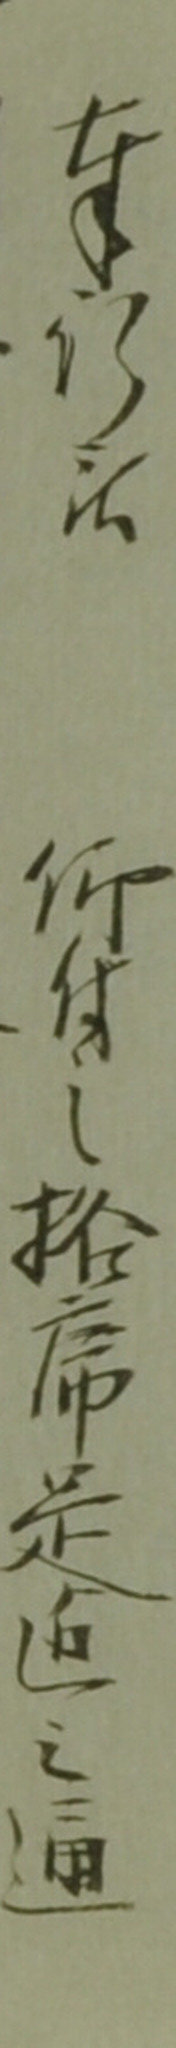奉行被仰付之格席是迄之通
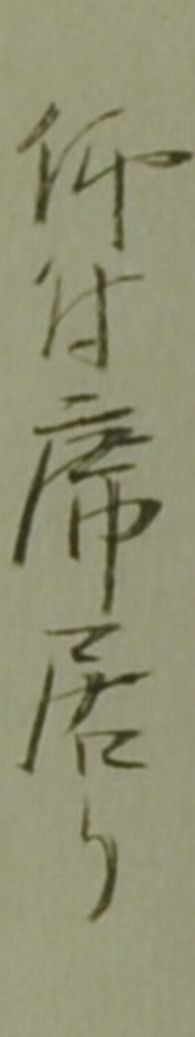仰付席居り
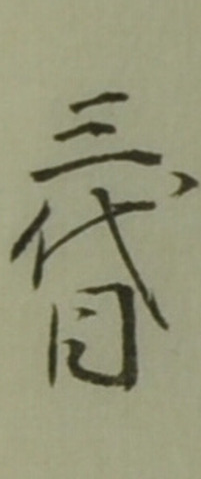三代目

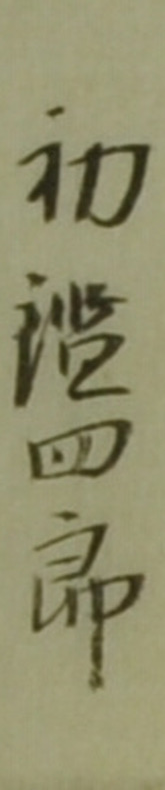初鑑四郎
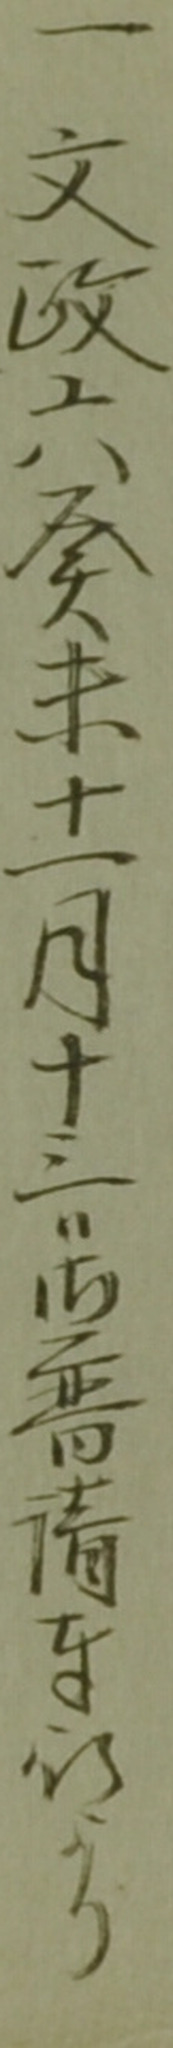一文政六癸未十一月十三日御普請奉行より
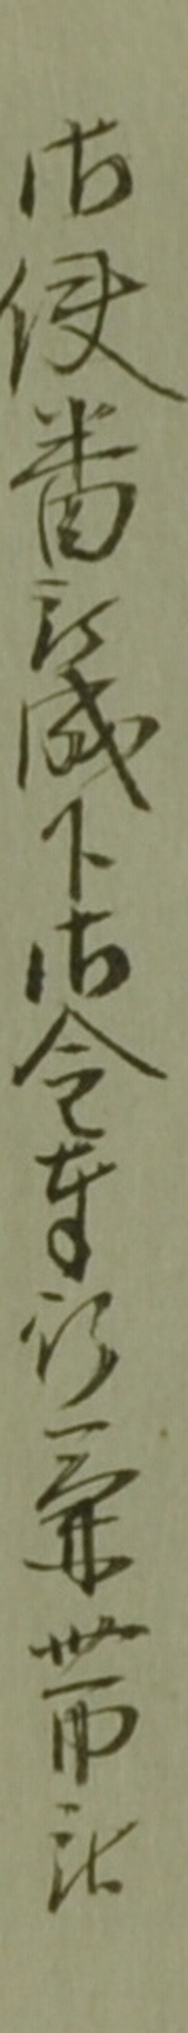御使番被成下御金奉行兼帯被
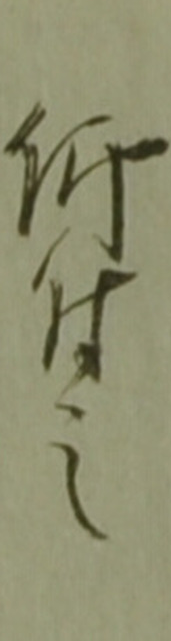仰付之
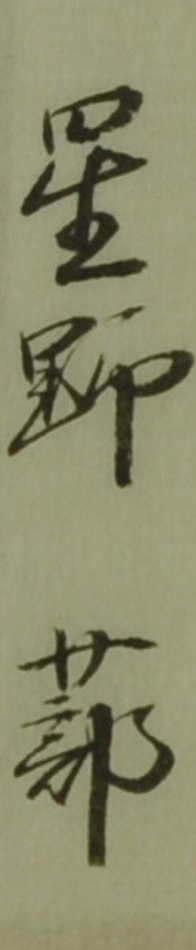星野蔀
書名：諸御役代々録（七）
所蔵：伊那市立高遠町図書館・合同会社AMANE
